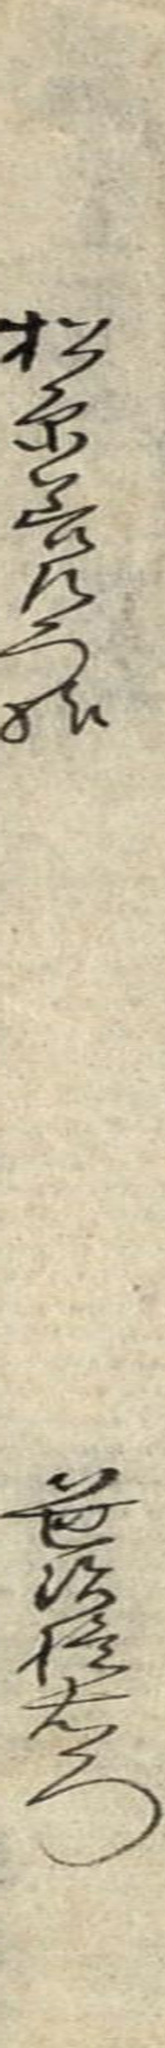松原善左衛門様笹治権右衛門
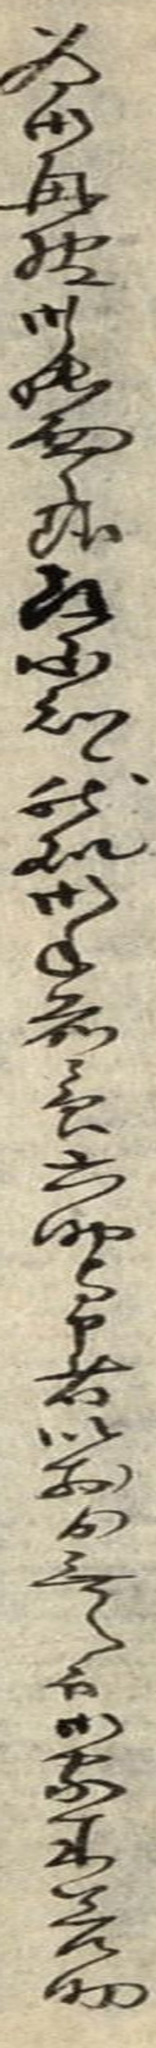為御再報御紙面之趣致承知候然処御手前に而は六助と申者以前ゟ無之候に付御家来善助
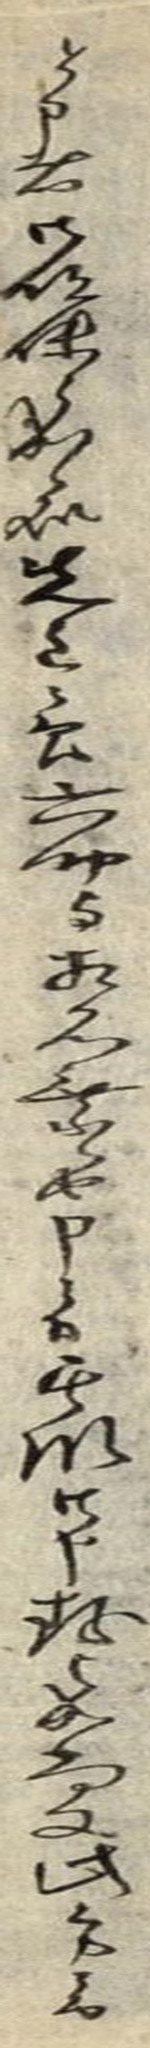と申者御吟味被成候処先主に而は六助と相名乗候由申に付其段被申越被成尚又此方に而
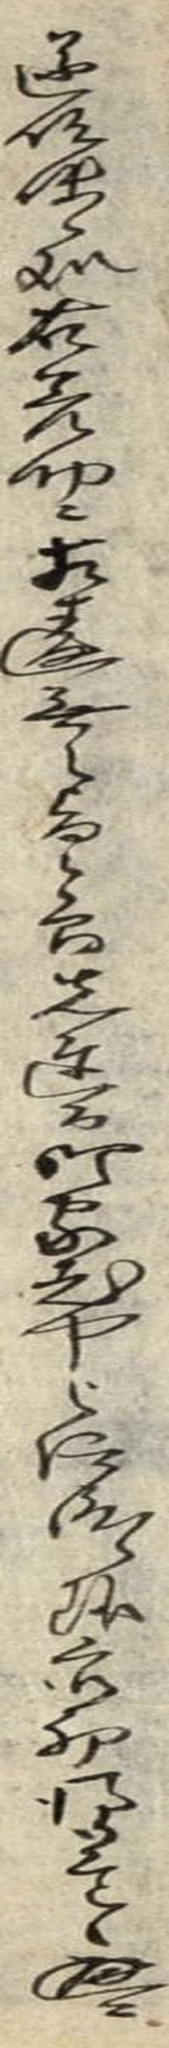遂吟味候処右善助に相違無之旨に候間先達而御家老中被仰渡候趣最初得御意候通に
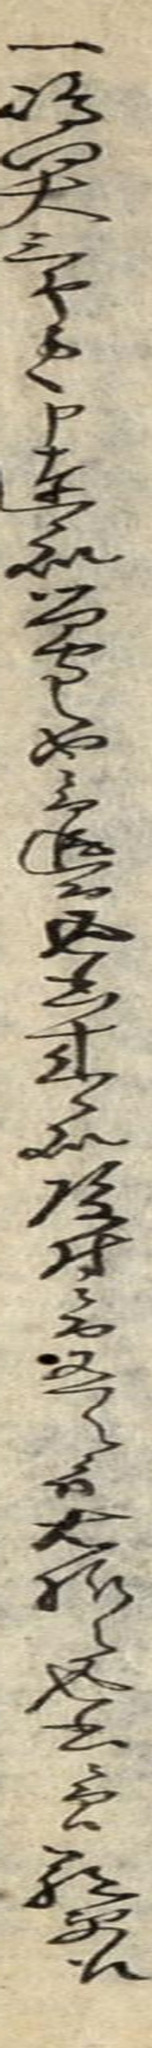一嶋田大三郎方へ申達候処留守之由に而追而返書来候処殿付に而有之候に付右様之返書に而は難受取
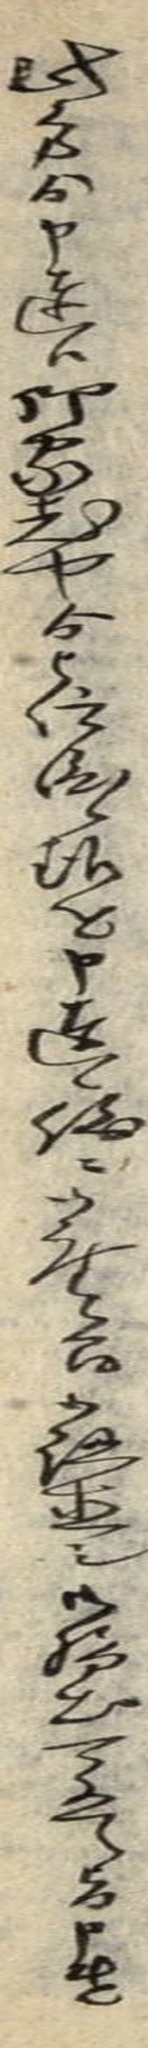此方ゟ申達候は御家老中ゟ被仰渡候趣を申達候儀に御座候間御認直し御指出可有之旨申遣
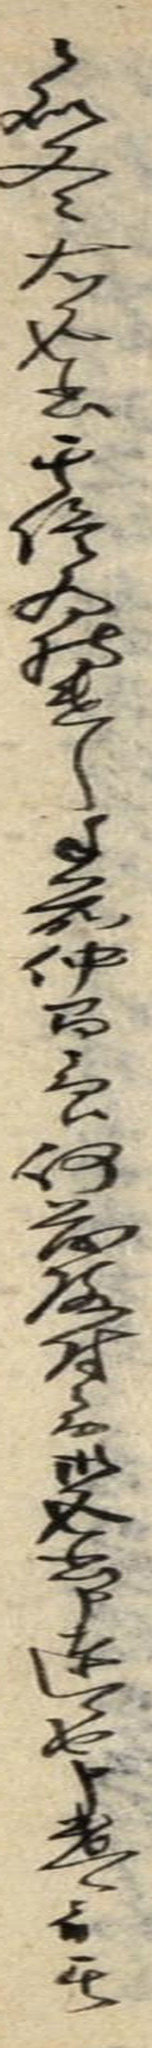候処又々右返書其侭為持遣之手前仲間に而は何も殿付に而御返書申達候由申遣候に付其

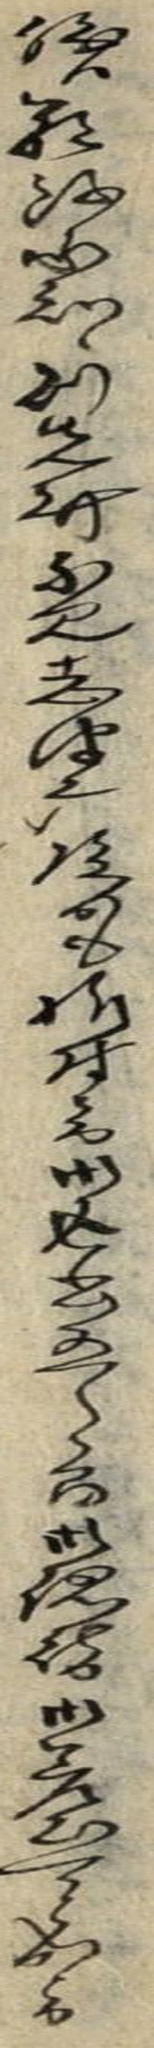儀は難致承知候則先刻永見志津摩殿ゟも様付に而御返書有之候間御認替御差出可被成旨
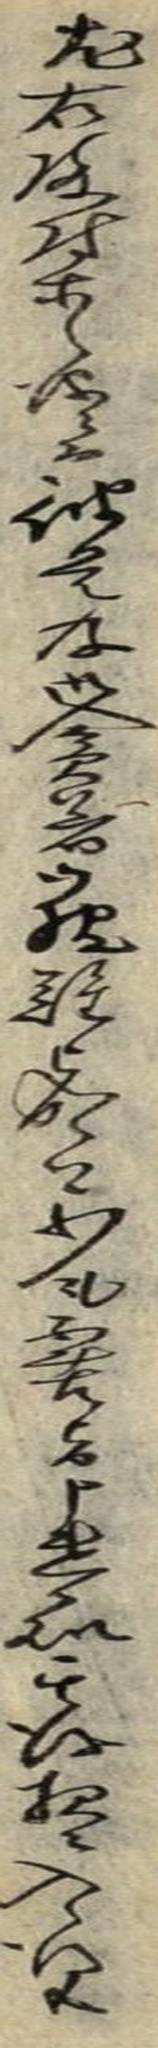尤右殿付等之儀に而彼是及御貪着御報難被成候はゝ少も不苦旨申遣候処其後夜に入候得共
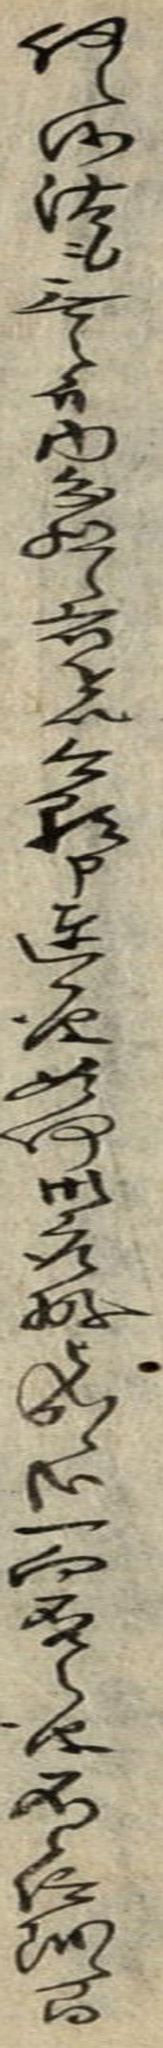何之沙汰も無之候付内分組之者を以今朝申達候儀如何御取扱被成候哉一向否之儀不被仰越候間
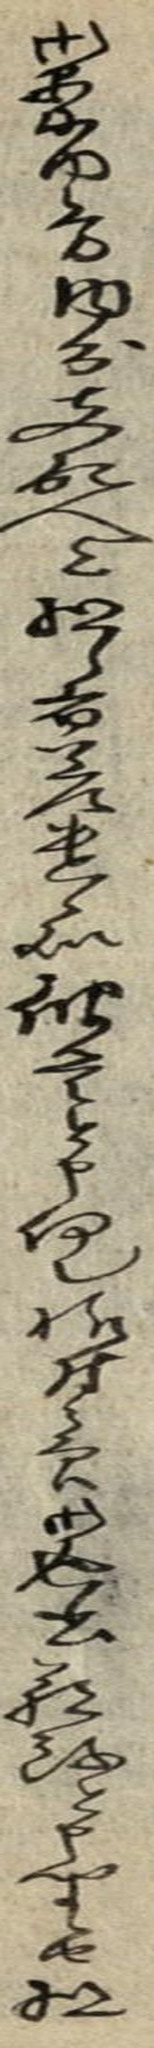御案内方内分支配人迄組之者差遣候処彼是と申何れ様付に而は御返書難致と申聞候由組
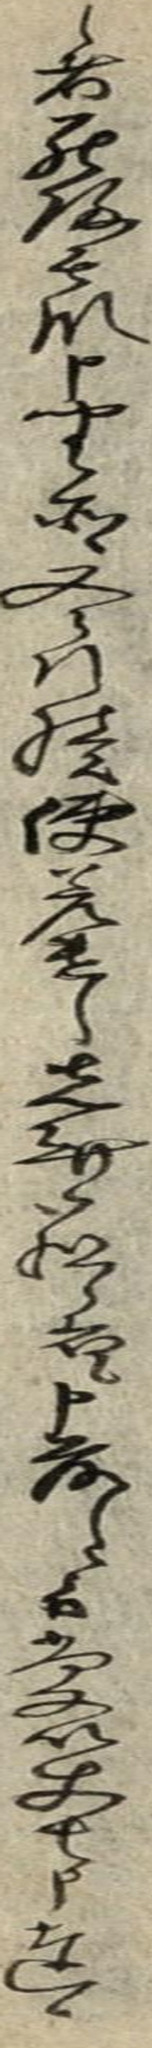之者罷帰其段申聞候所へ又々引続便差遣之先刻御組之者へ申渡候に付尚又以使者申達候
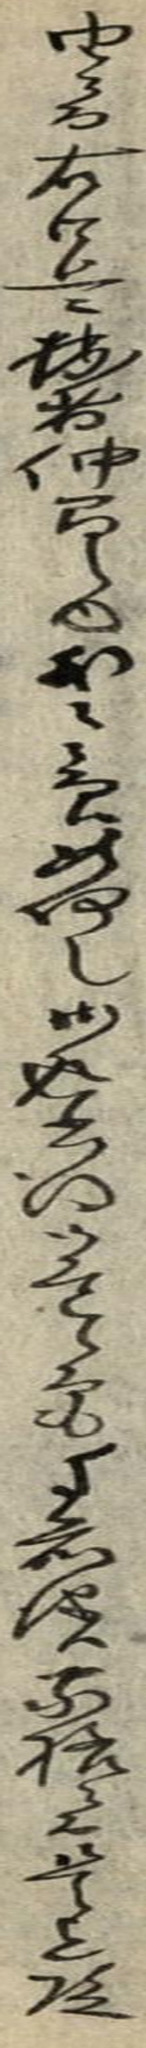由に而右口上に拙者仲間之内外々に而は如何之御返書得御意候而も手前儀は家格に而是迄殿
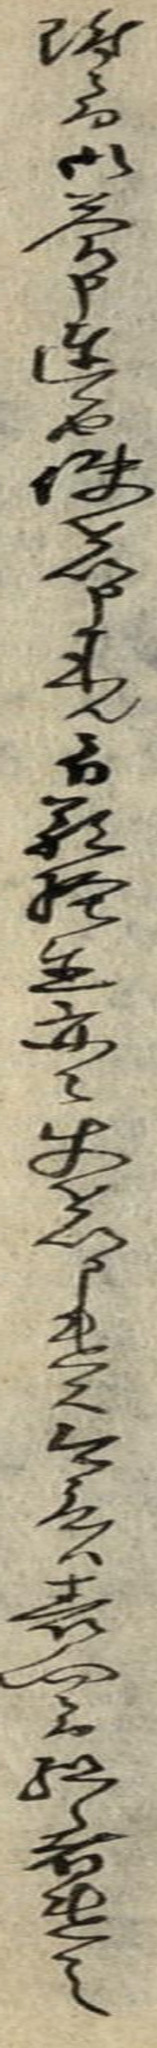附に而御答申達候由使を以申来るに付難捨置亦々使を以申遣ス今度は表向に而組之者遣之
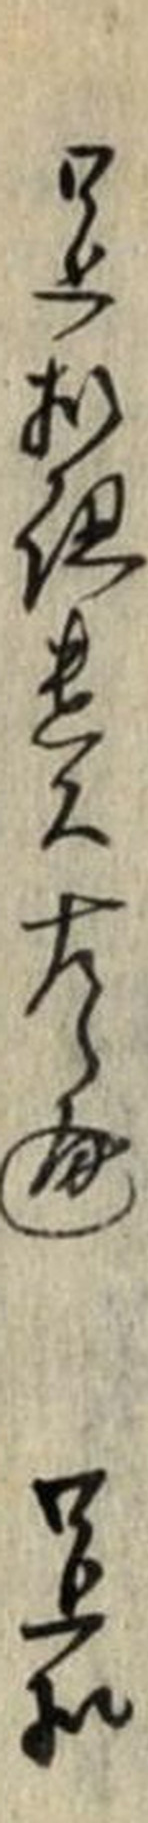口上扣認遣ス左之通口上扣
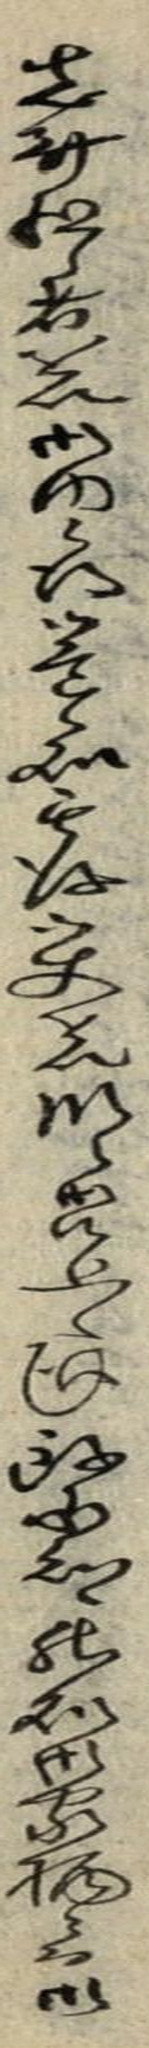先刻組之者を以御内々得御意候処其後御使を以段々御口上之趣致承知候然処御家柄に而御
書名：蒐輯之部
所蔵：福井県文書館 Fukui Prefectural Archives
